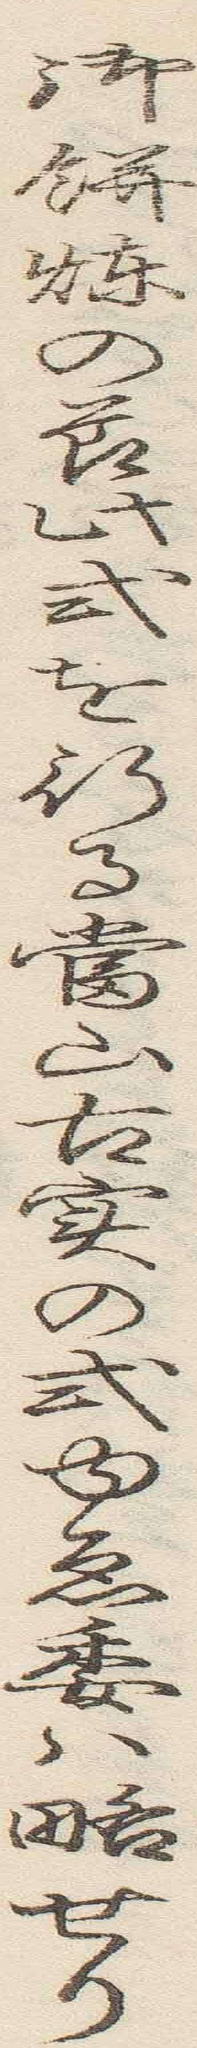御餅練の節此式を行る當山古実の式ゆゑ委は略せり
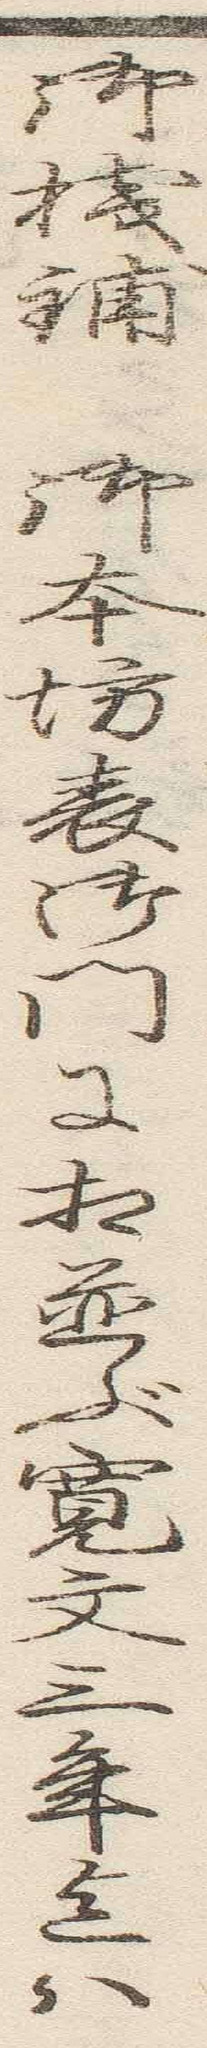御棧鋪御本坊表御門に相並ぶ寛文三年迄は
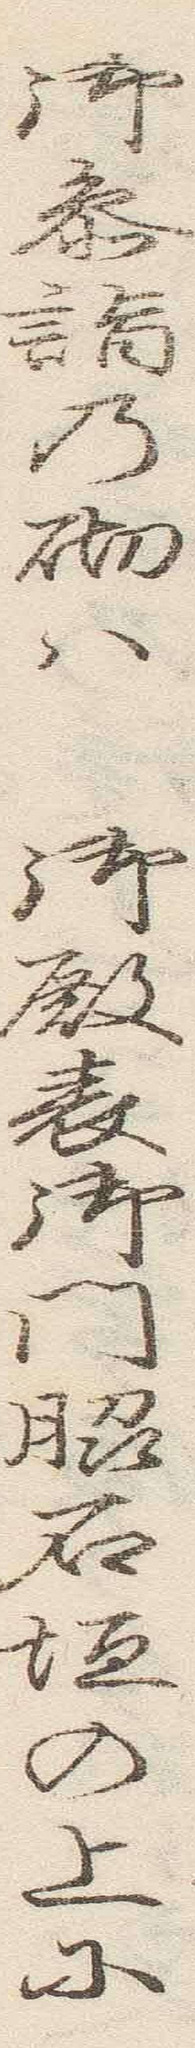御参詣の砌は御殿表御門脇石垣の上に
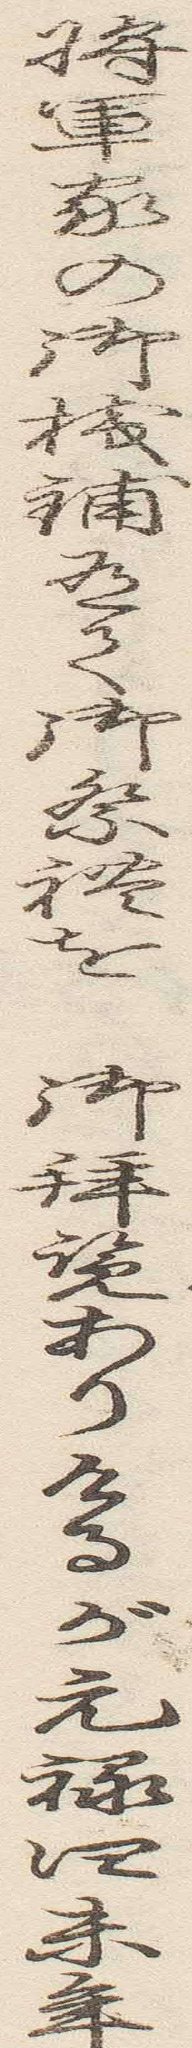将軍家の御棧鋪有て御祭禮を御拜覧ありけるが元禄四未年
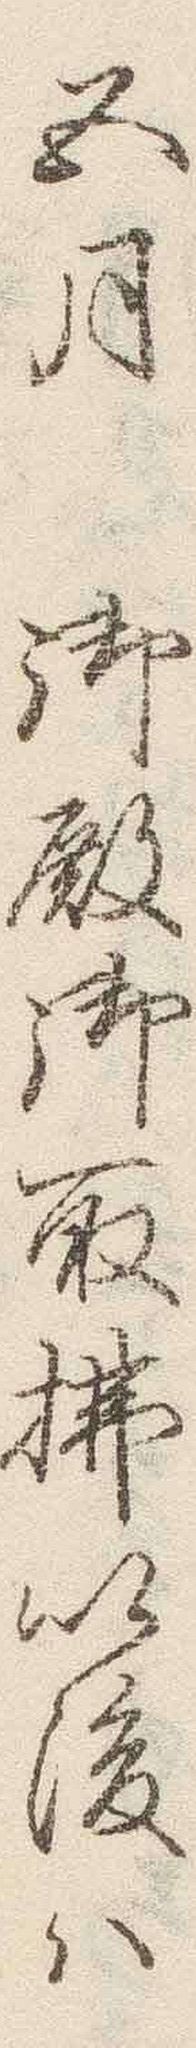五月御殿御取拂以後は
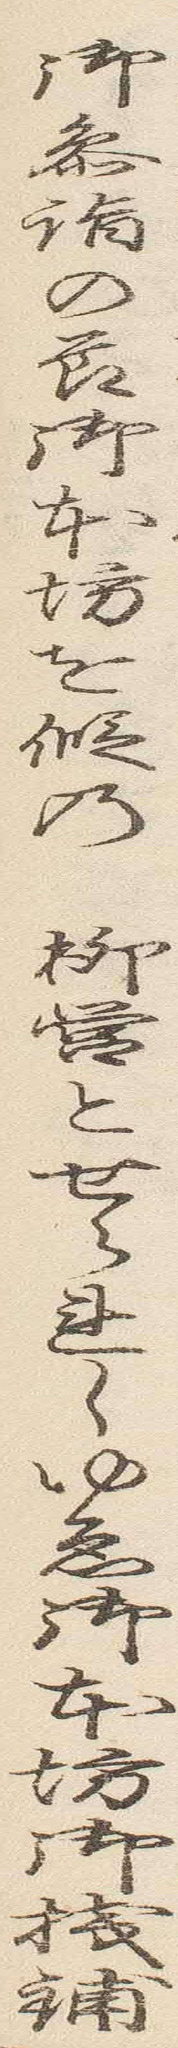御参詣の節御本坊を假の柳営とせられしゆゑ御本坊御棧鋪
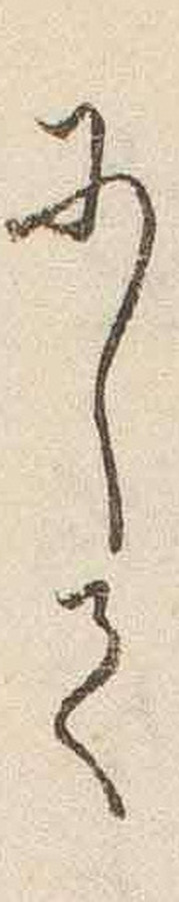にして
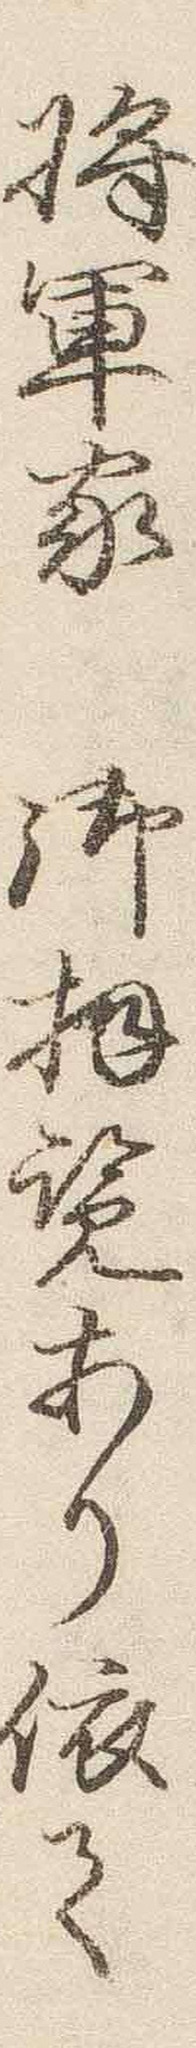将軍家御拜覧あり依て
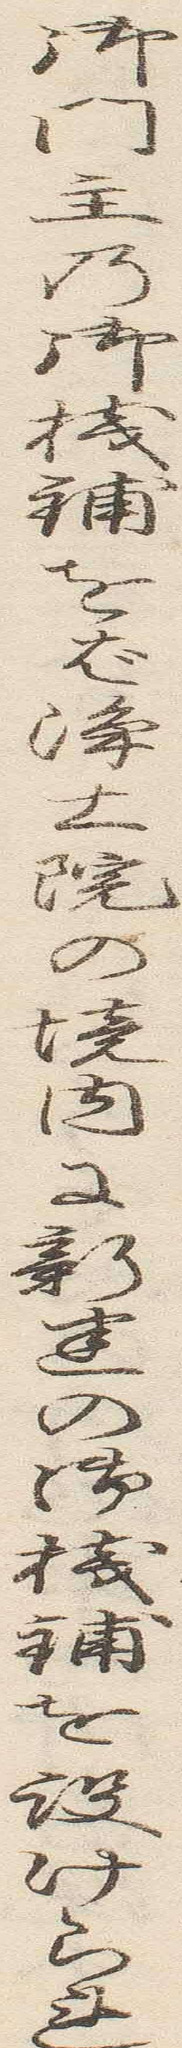御門主の御棧鋪をば浄土院の境内に新建の御棧鋪を設けられ
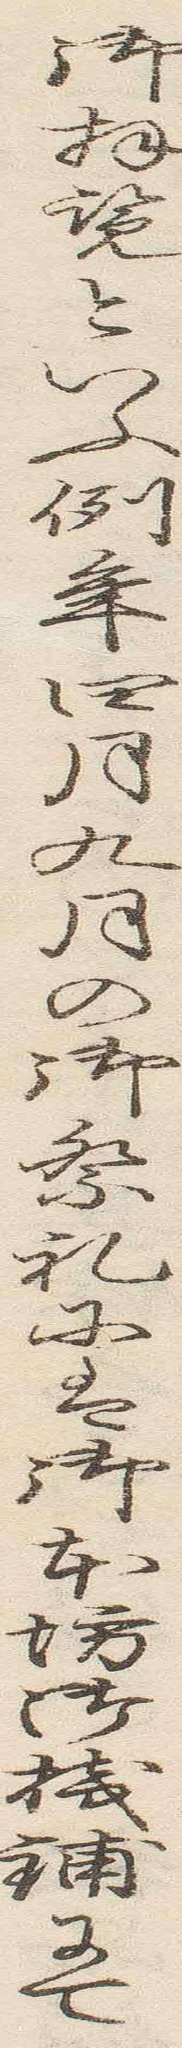御拜覧といふ例年四月九月の御祭礼には御本坊御棧鋪にて
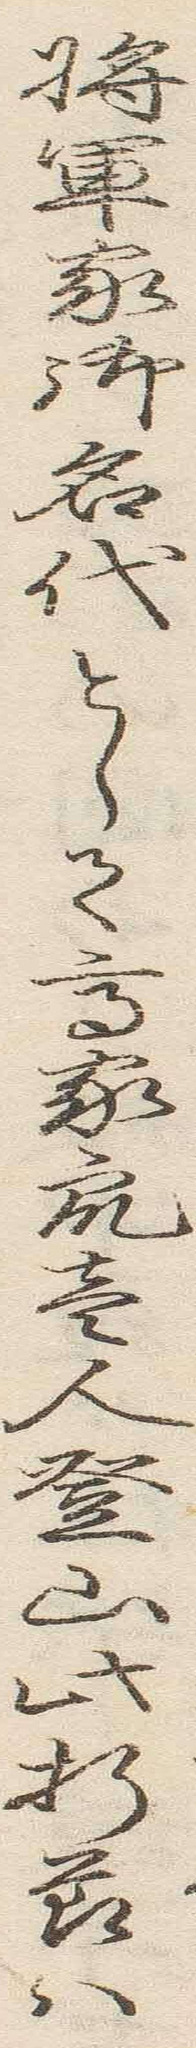将軍家御名代として高家衆壱人登山此折節は
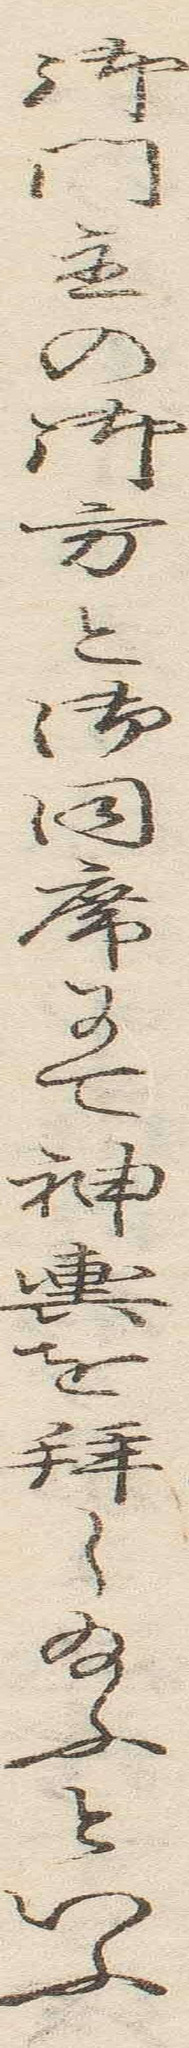御門主の御方と御同席にて神輿を拜し給ふといふ
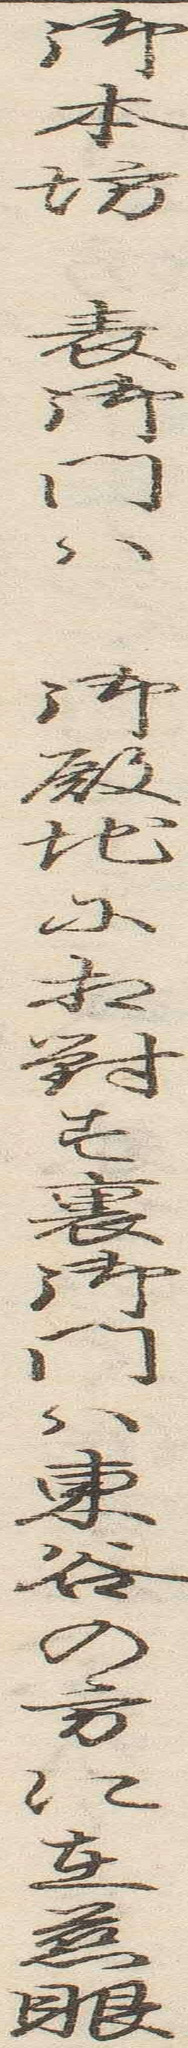御本坊表御門は御殿地に相對す裏御門は東谷の方に在慈眼
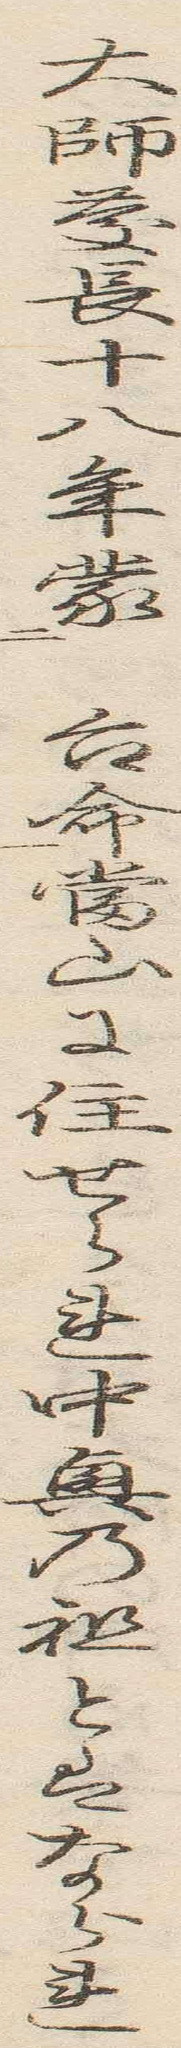大師慶長十八年蒙台命當山に住せられ中興の祖とはなられ
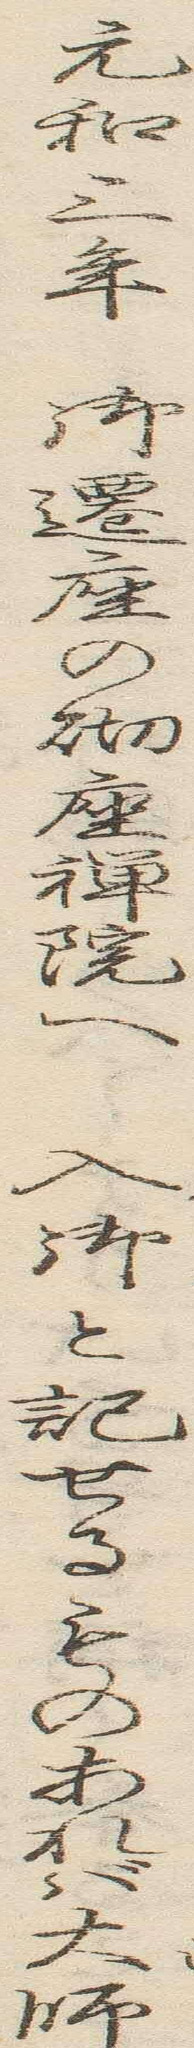元和三年御遷座の砌座禅院へ入御と記せるものあれば大師
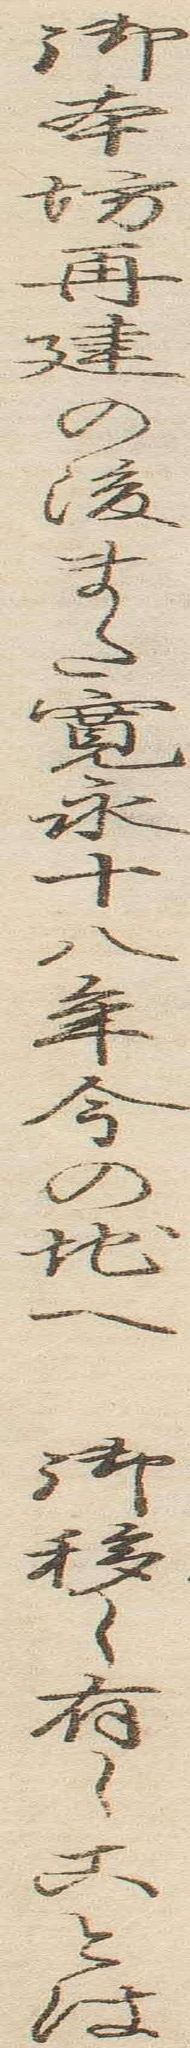御本坊再建の後また寛永十八年今の地へ御移し有しことは
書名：日光山志
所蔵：東京学芸大学附属図書館 国文学研究資料館
